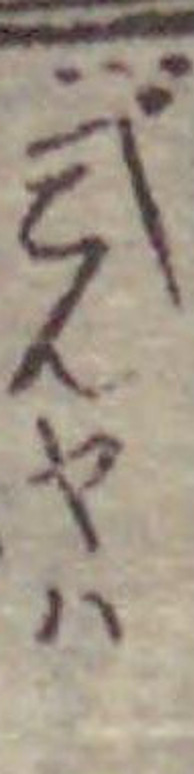〽こんやは
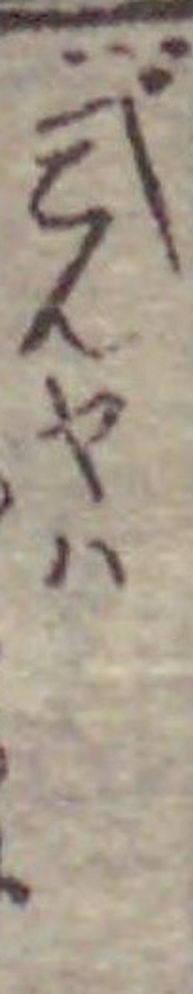〽こんやは
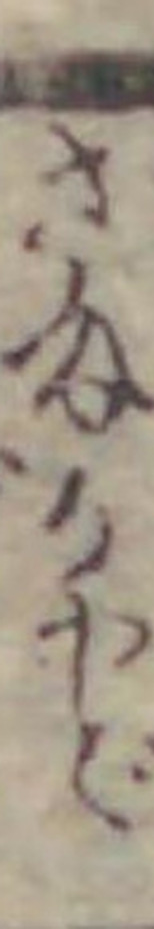さまかやど
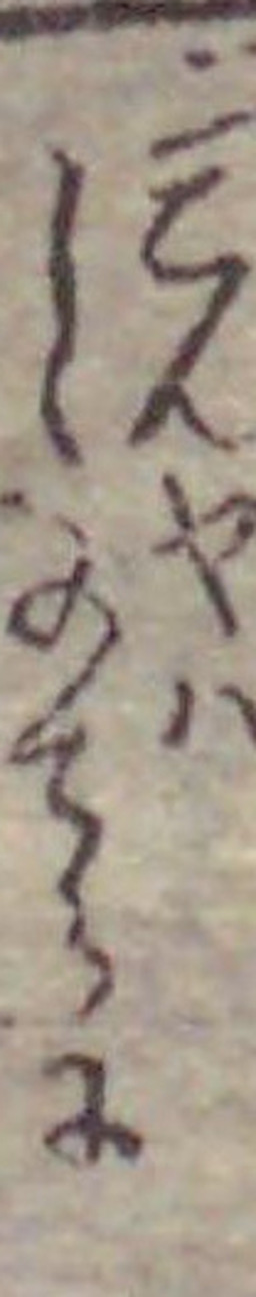したのてらに
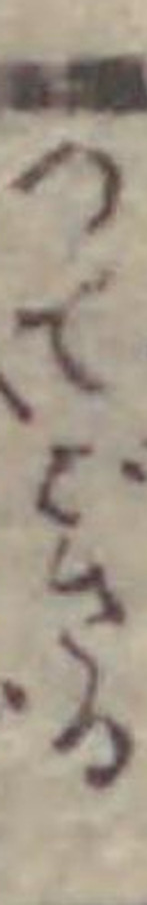つてごさる
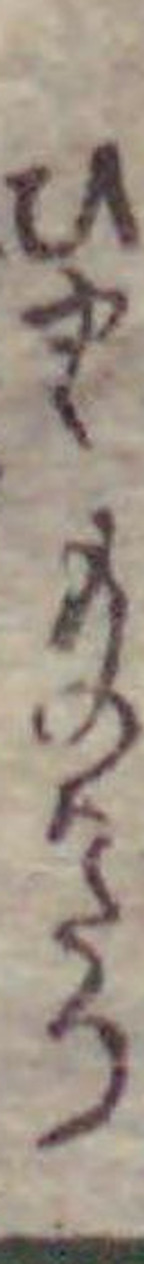ひやくものかたり
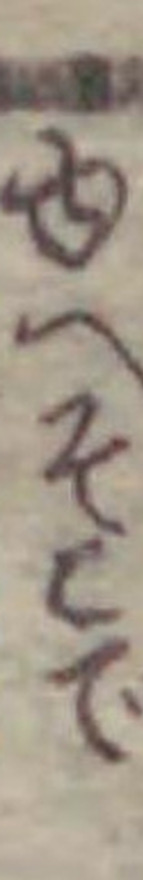ゆへそこで
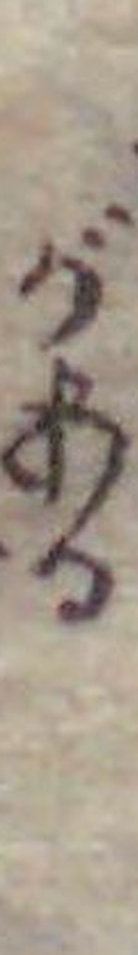がある
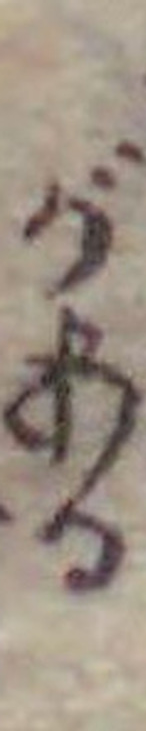がある
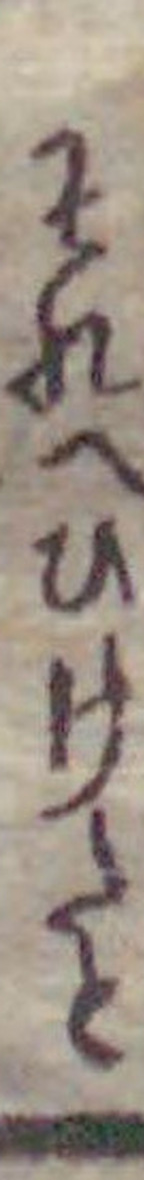それへひけたら
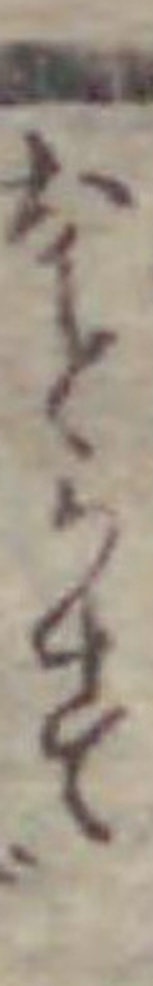おとかす
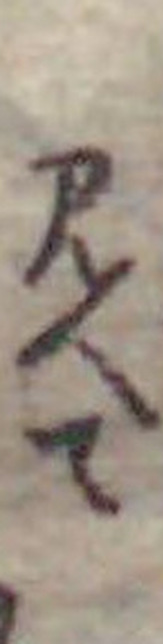見へて
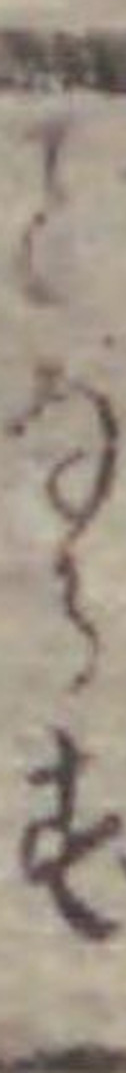ことならず
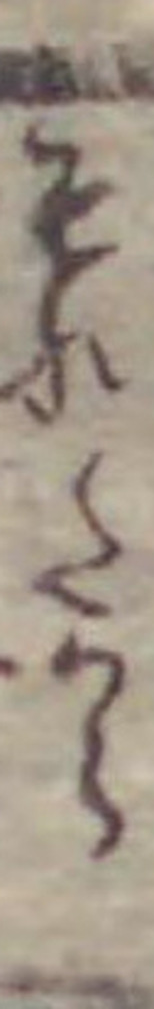それたから
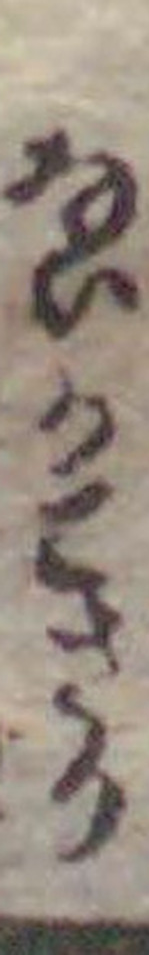ないかこさり
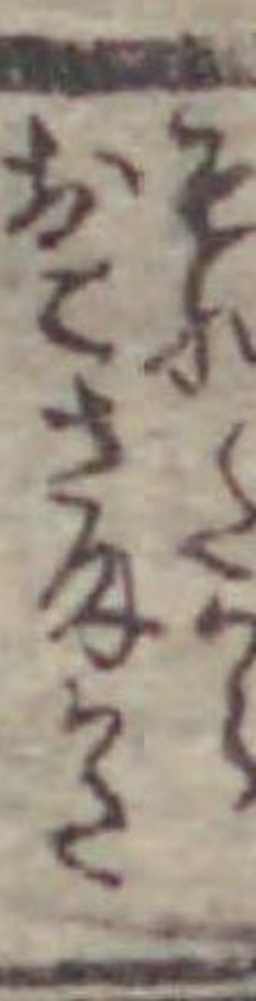おこさまかた
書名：化物見世開 : 2巻
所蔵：国立国会図書館 National Diet Library, JAPAN
